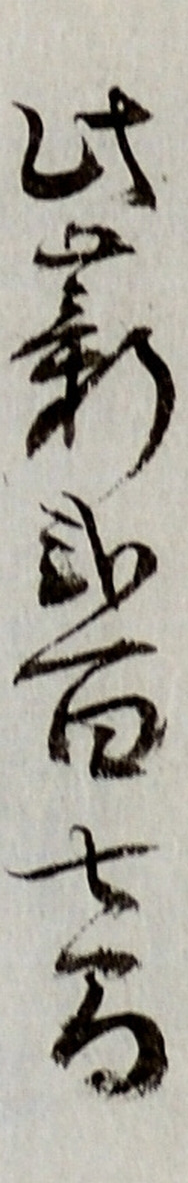此薪弐百七間
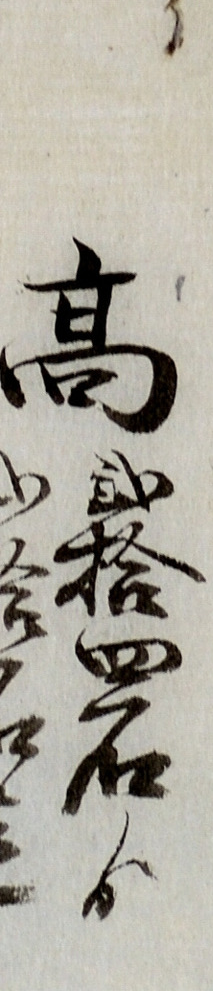高弐拾四石ゟ
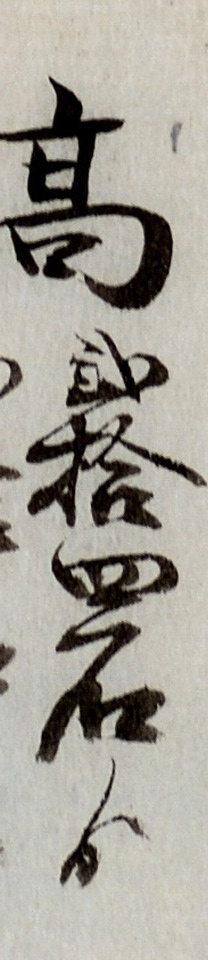高弐拾四石ゟ
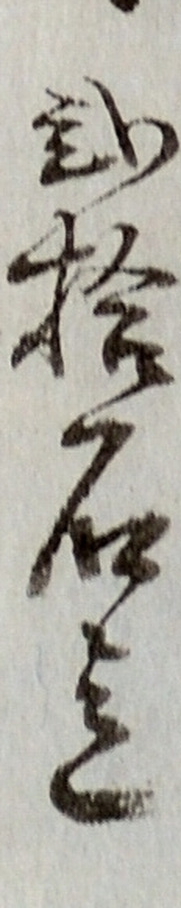弐拾石迄
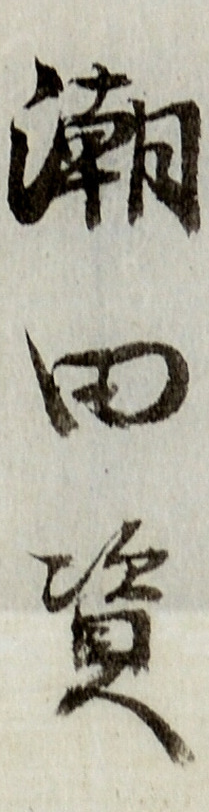潮田資
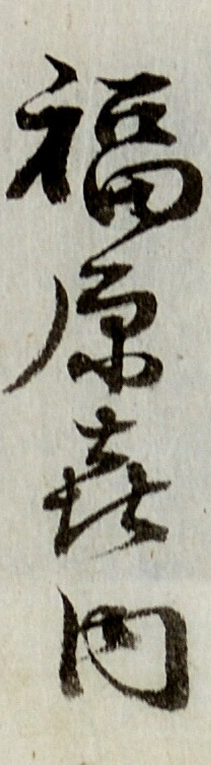福原喜内
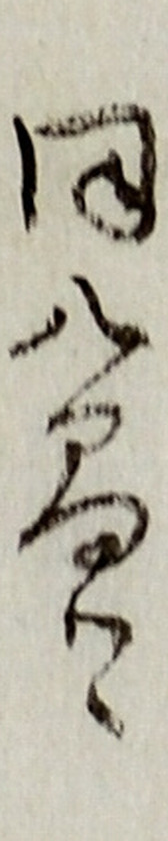同八間ツヽ
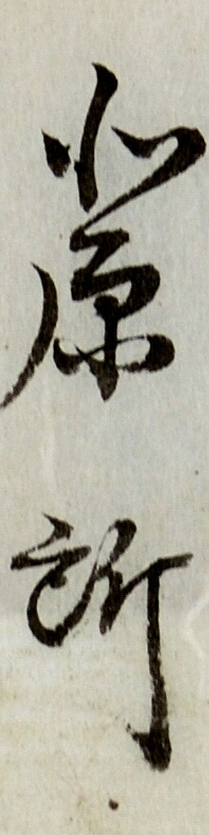北原所
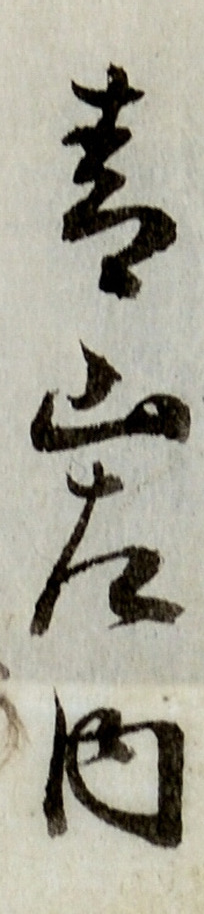青山左内
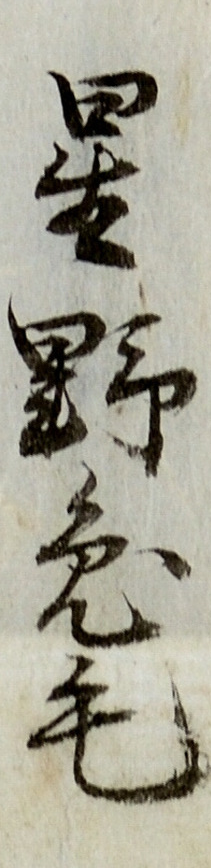星野色毛
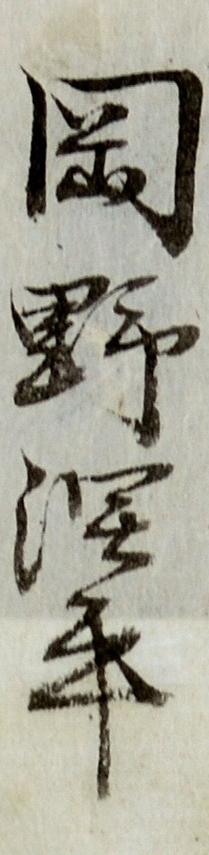岡野潤平
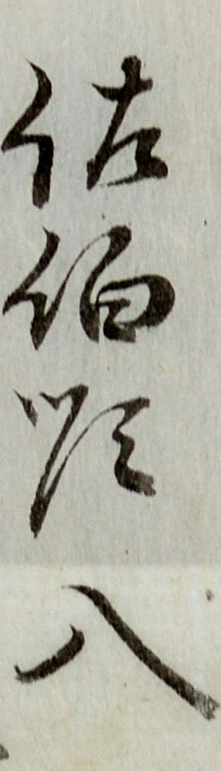佐伯順八

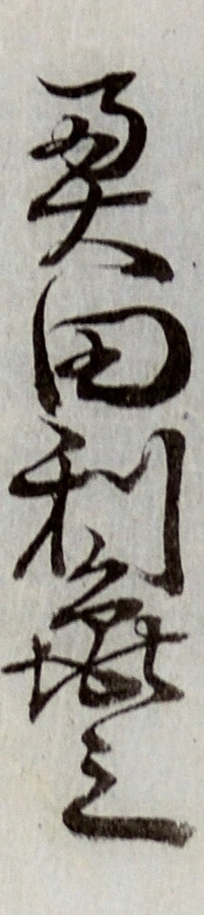奥田利亀三
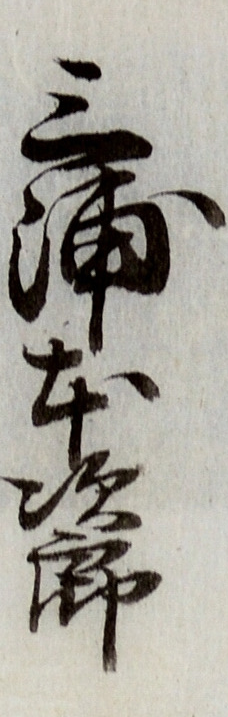三浦本次郎
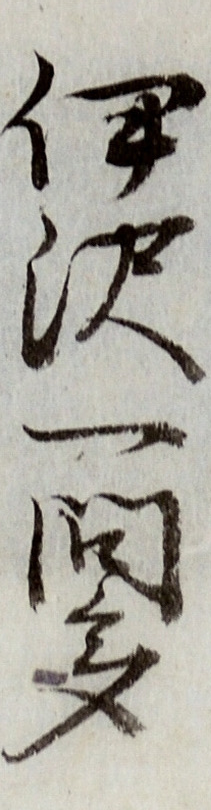伊沢一問多
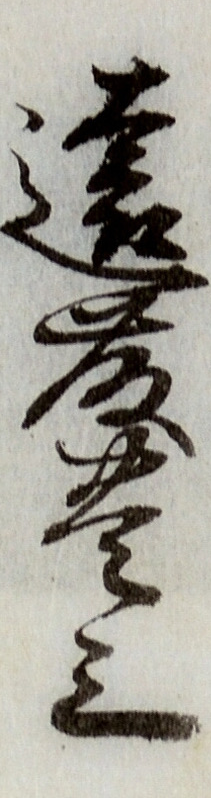遠藤豊三
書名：御藩中薪渡割合帳
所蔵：伊那市立高遠町図書館・合同会社AMANE
